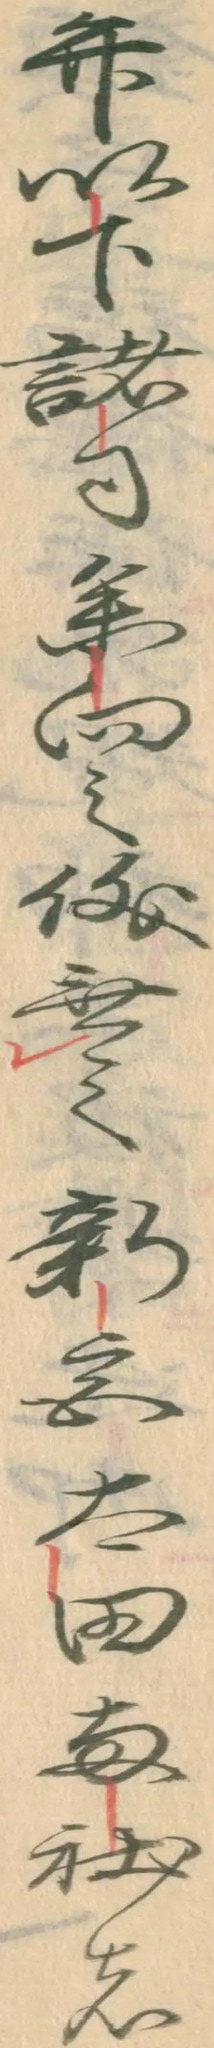弁以-下諸-司参-向之儀無之新-宮太_田両-社者
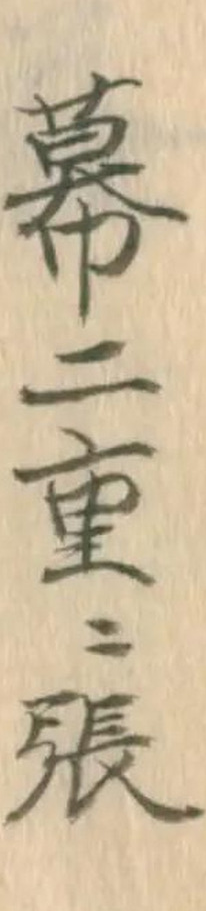幕二重ニ張
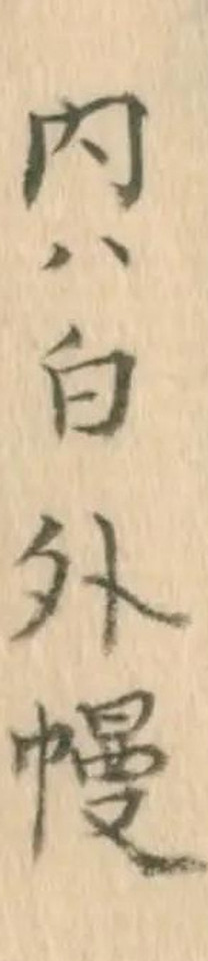内ハ白外幔
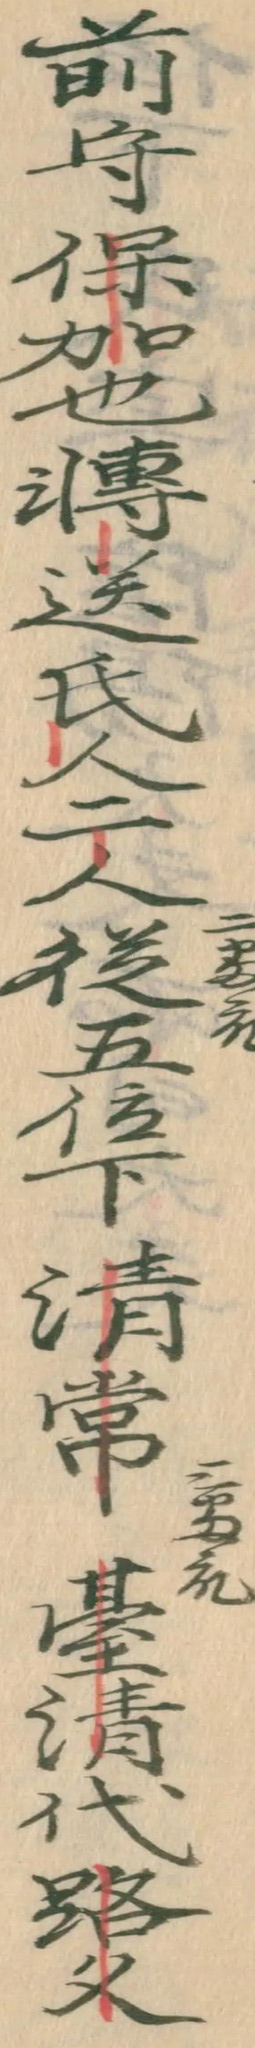前守保加也転-送氏二-人従五位下清常台清代路久

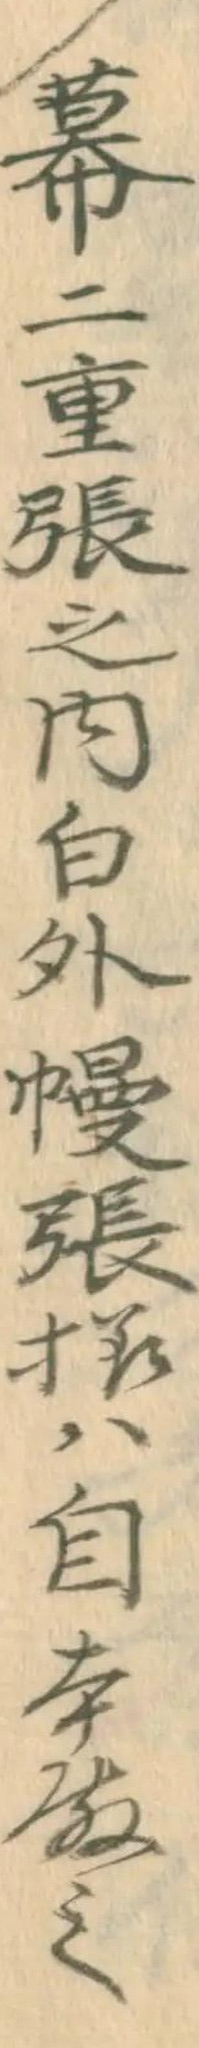幕二重張之内白外幔張様ハ自本殿之
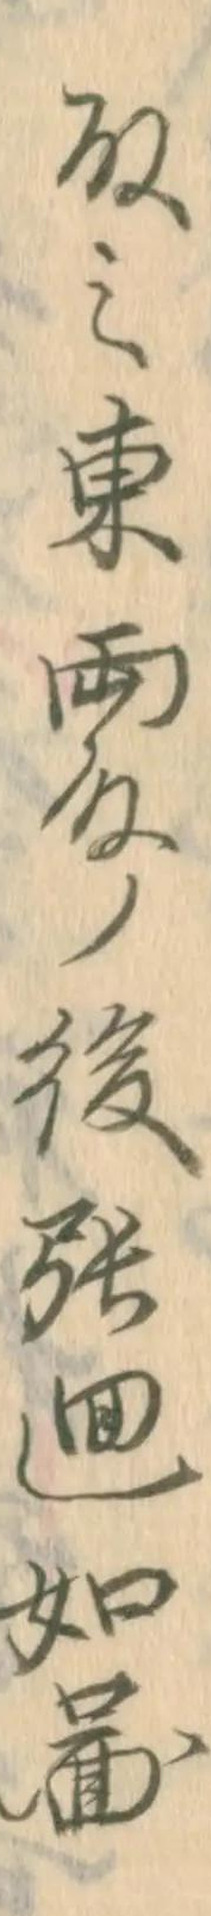殿之東両殿ノ後張廻如図
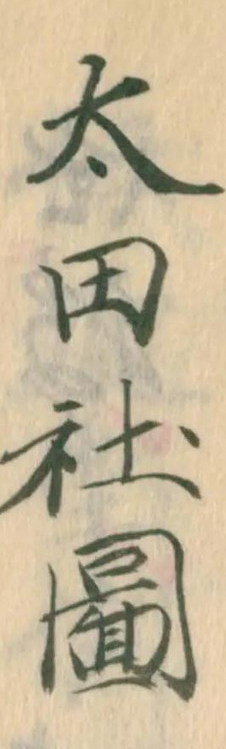太田社図
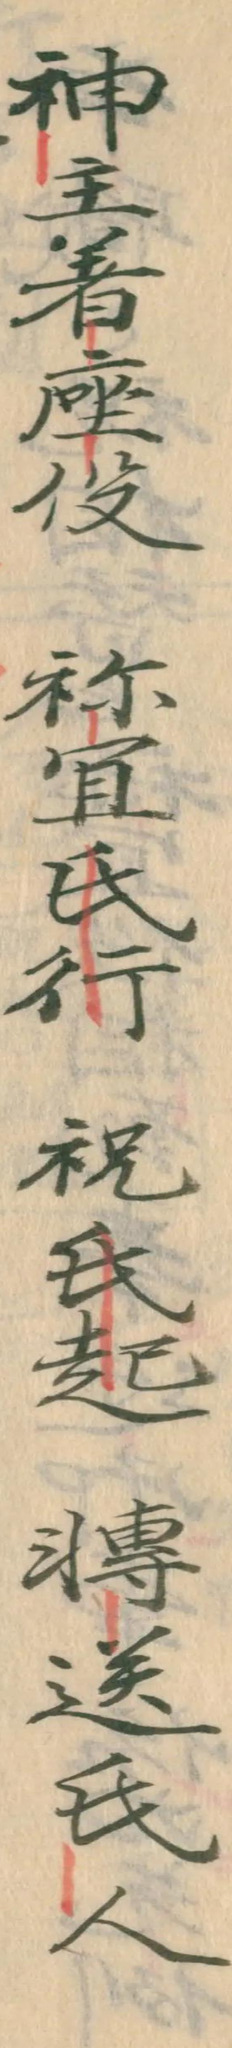神_主着-座-役祢-宜氏行祝氏起転-送氏
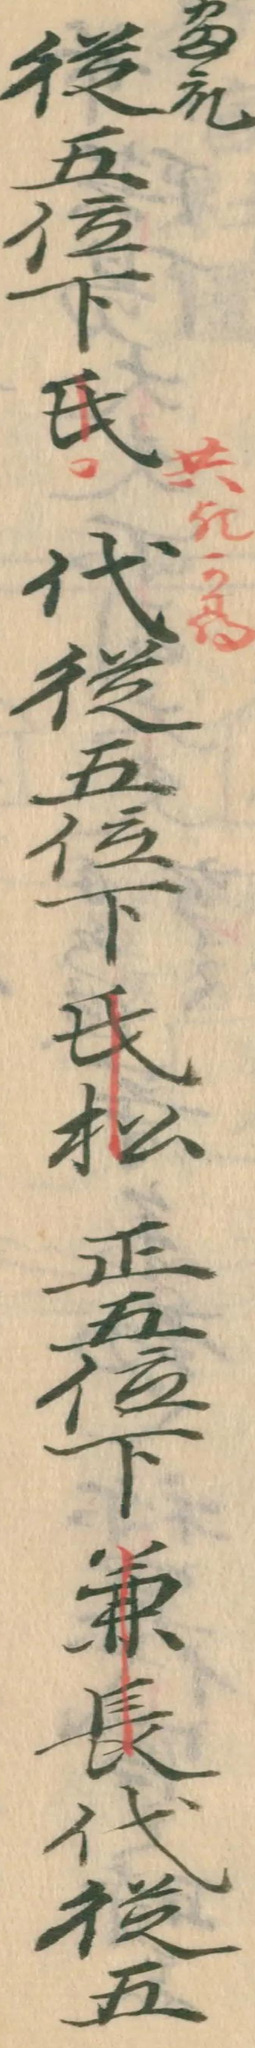従五位下氏￮代従五位下氏松正五位下兼長代従五
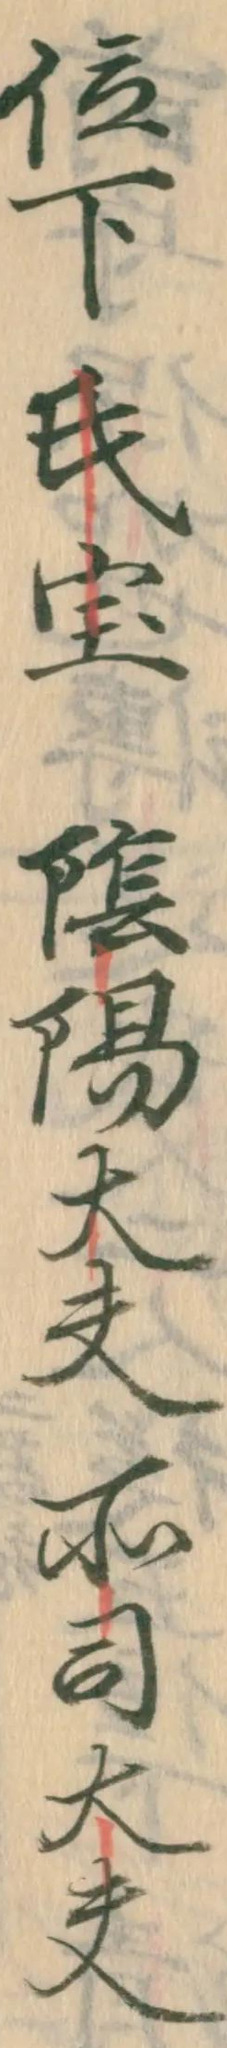位下氏宝陰-陽大-夫所-司大-夫
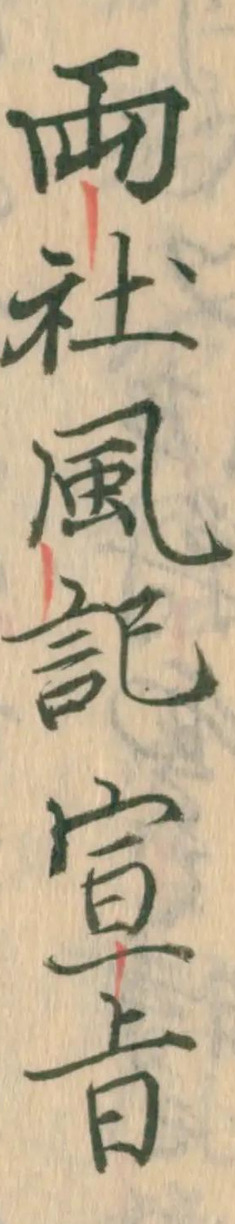両-社風_記宣-旨

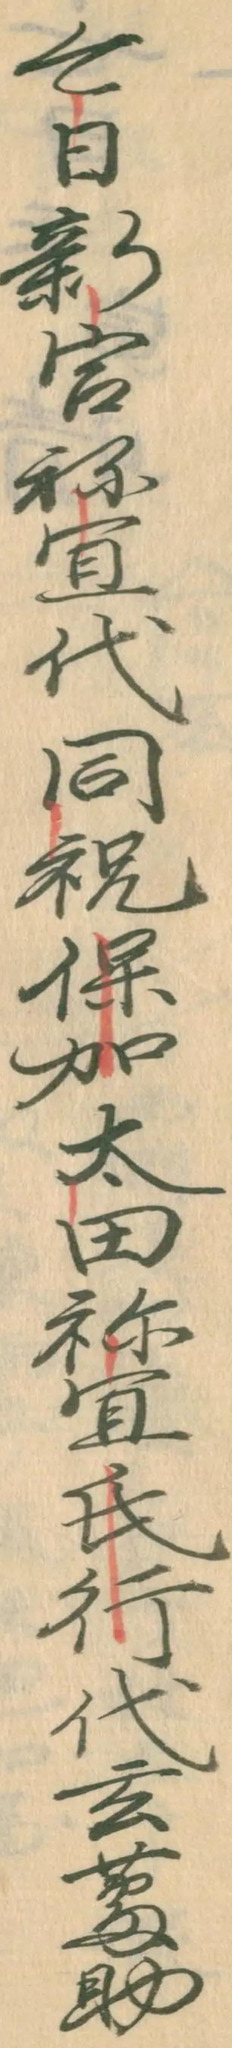今-日新-宮祢-宜代同_祝保加太_田祢-宜氏行代玄蕃助
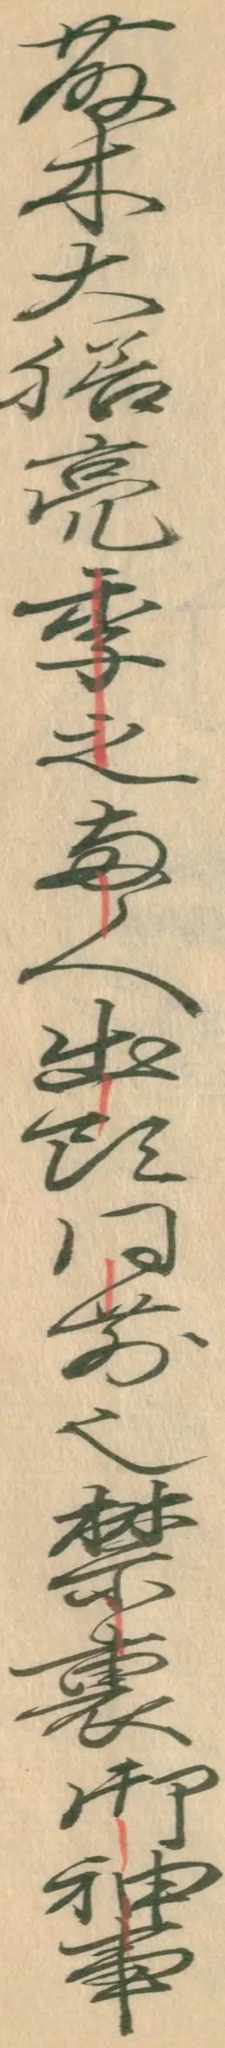藤木大膳亮季之両-人出-頭同-前也禁-裏御-神-事
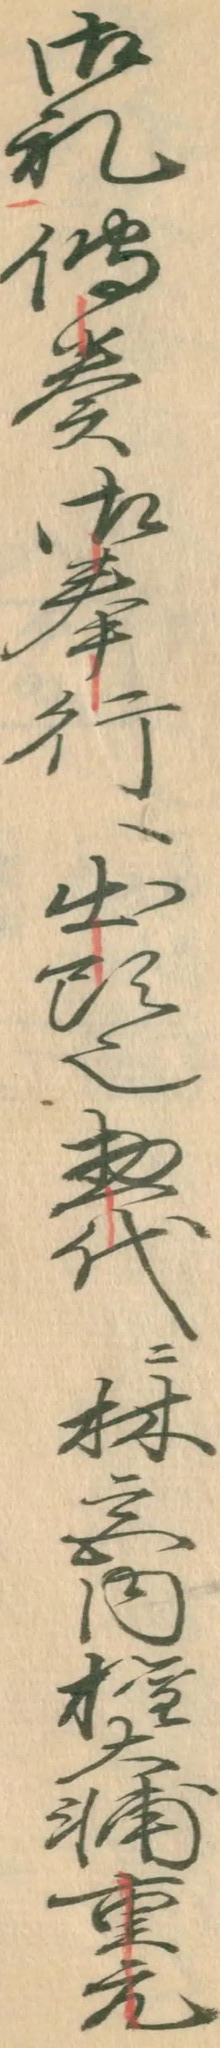御礼伝-奏御-奉-行へ出-頭也惣-代ニ林宮内権大輔重元
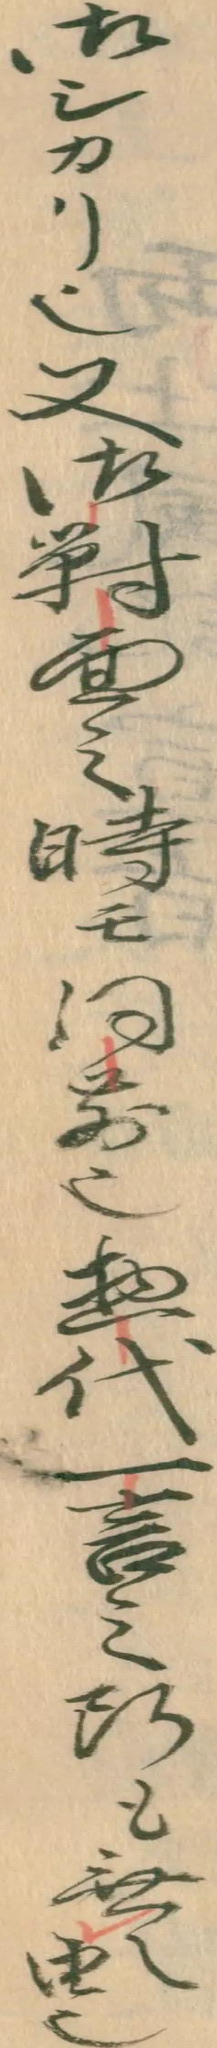御シカリ也又御-対-面之時モ同-前也惣-代一-言之断も無之由也
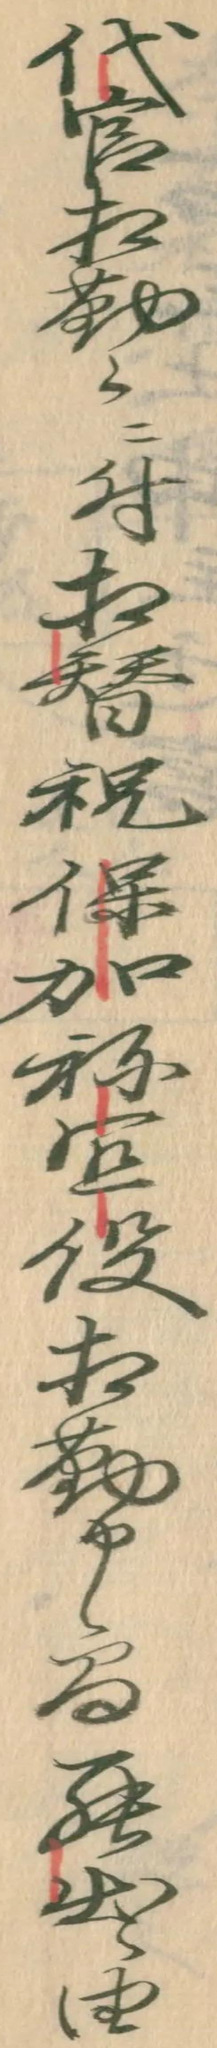代-官相勤候ニ付相_替祝保加祢-宜-役相勤申候間罷_出候由
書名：賀茂社記録. 第16冊
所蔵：国立国会図書館 National Diet Library, JAPAN
